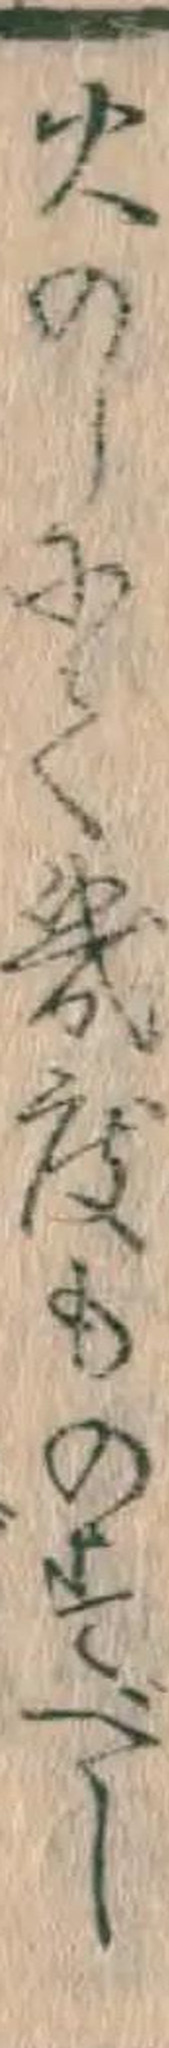火のしにて幾度ものすべし
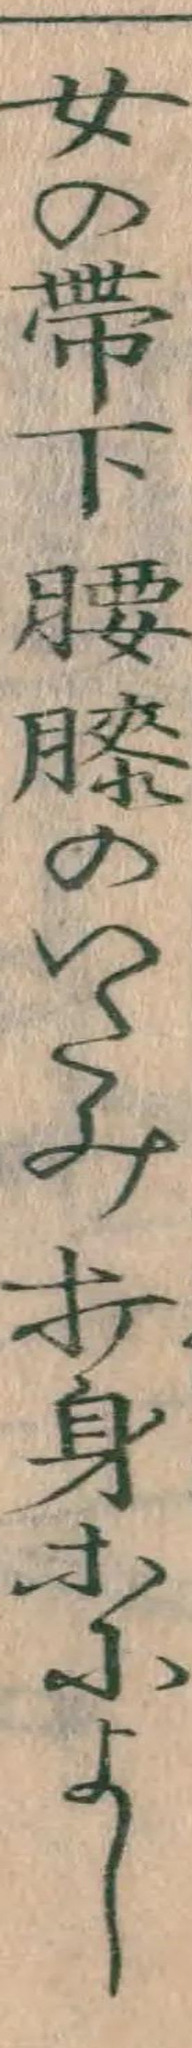女の帯下腰膝のいたみ打身等によし
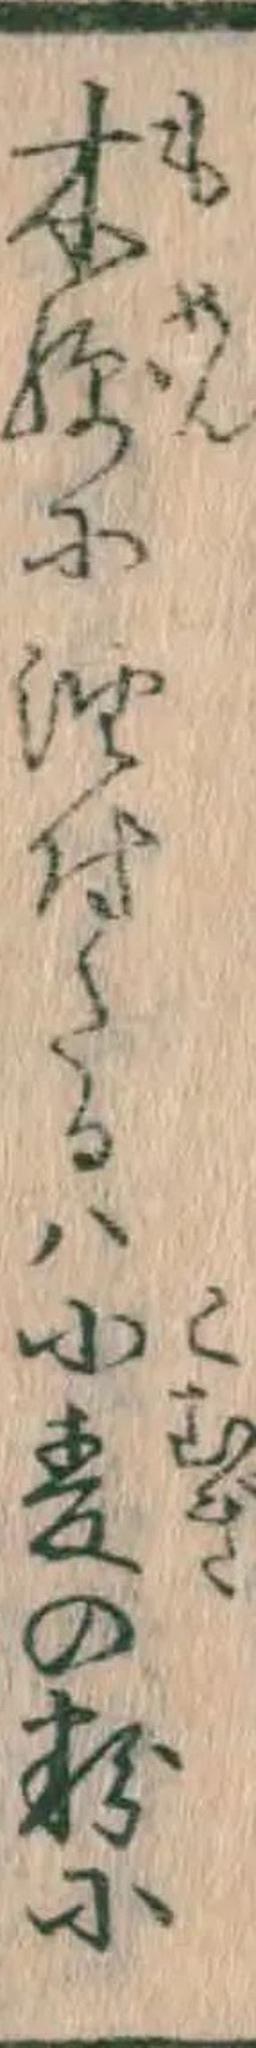木綿に油付たるは小麦の粉に
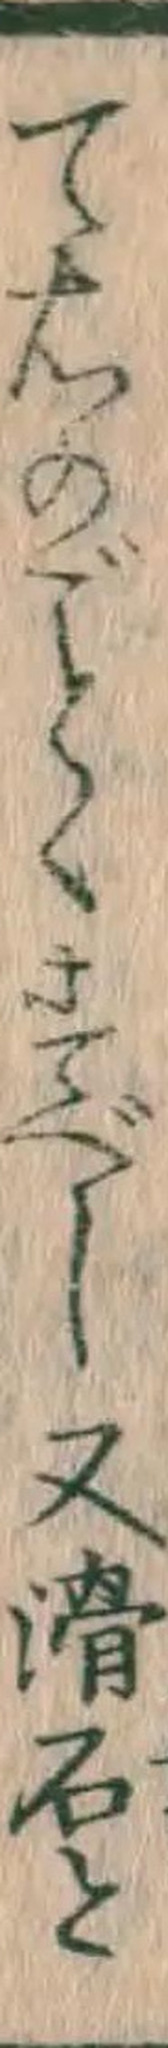て右のごとくすべし又滑石と
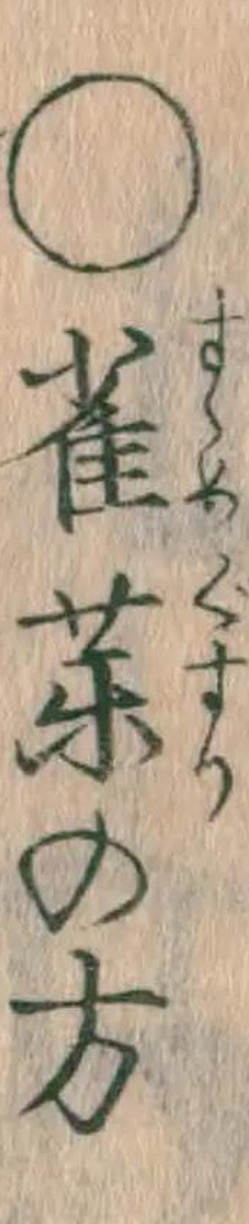○雀薬の方
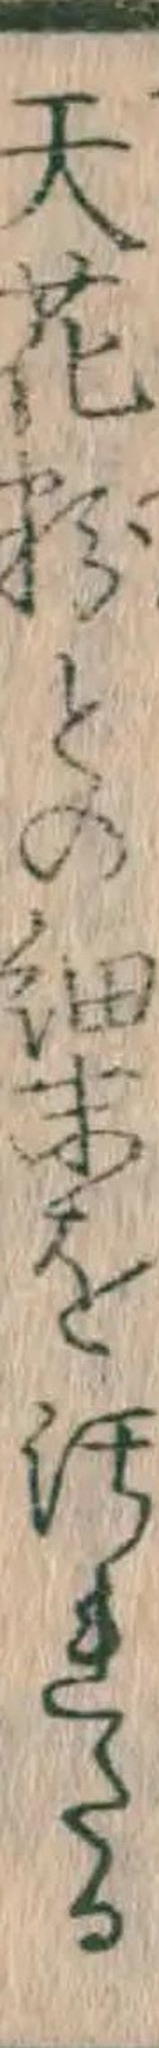天花粉との細末を汚れたる
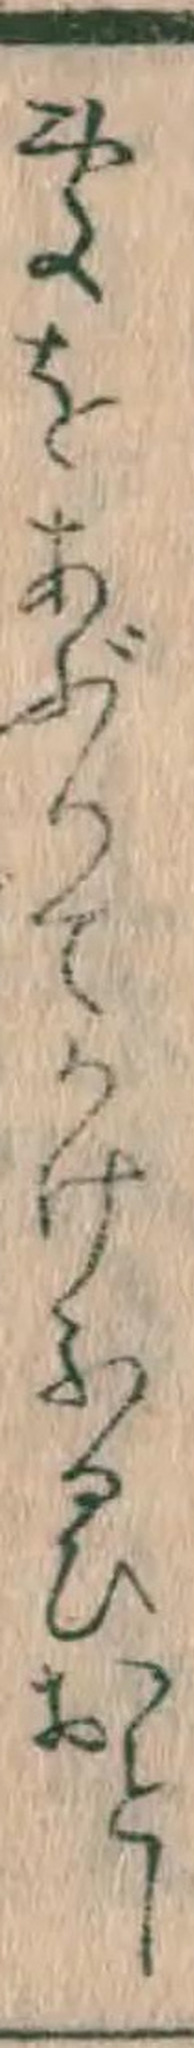処をあぶりてかけふるひおとし
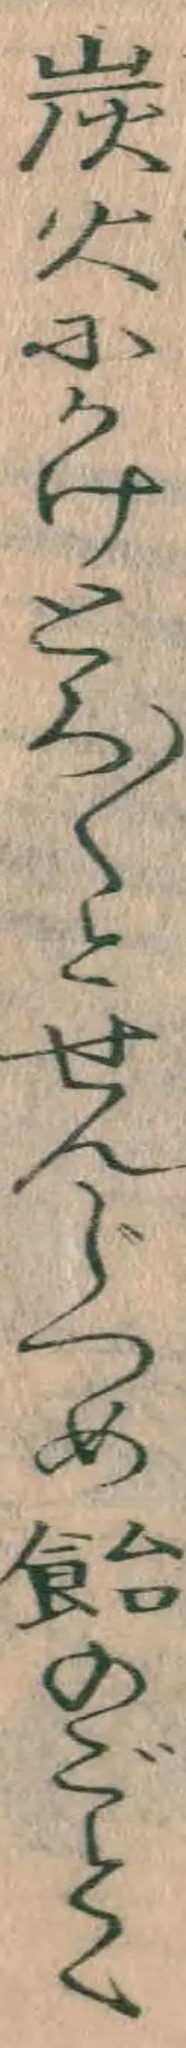炭火にかけとろ〳〵とせんじつめ飴のごとく
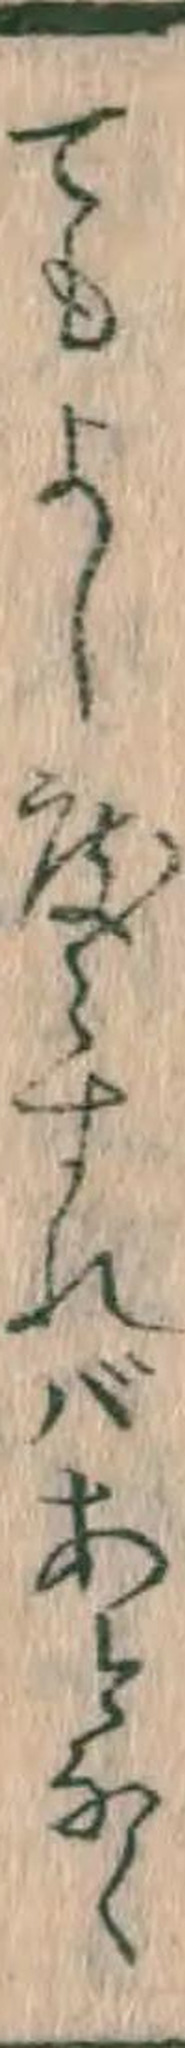てもよし度々すればあとなく
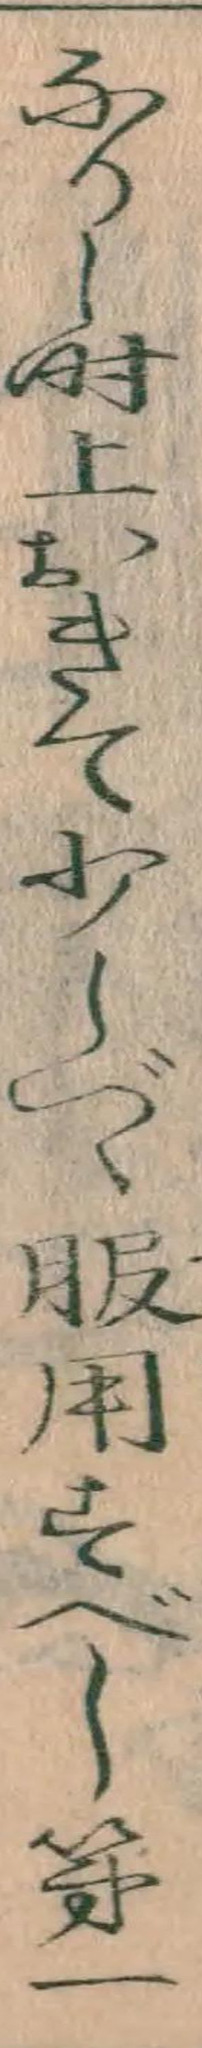なりし時上おきて少しづゝ服用すべし第一
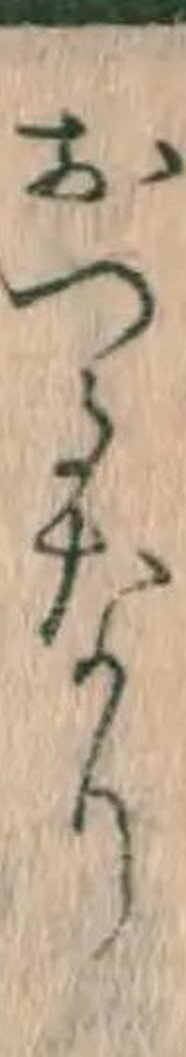おつるなり
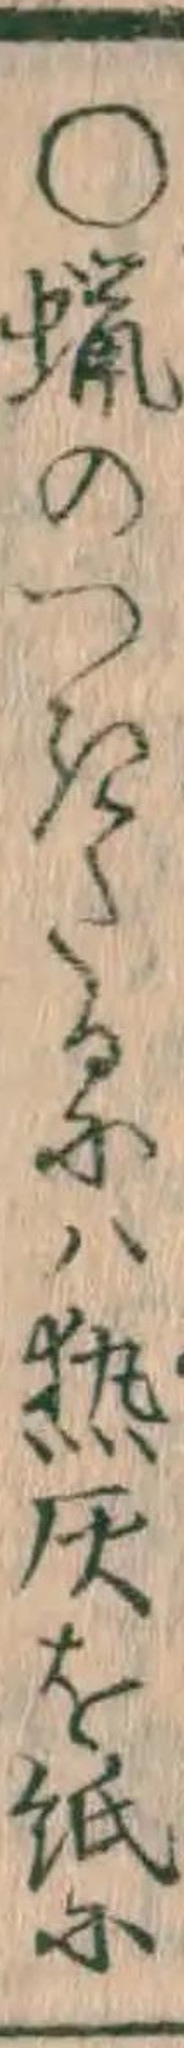○蝋のつきたるには熱灰を紙に
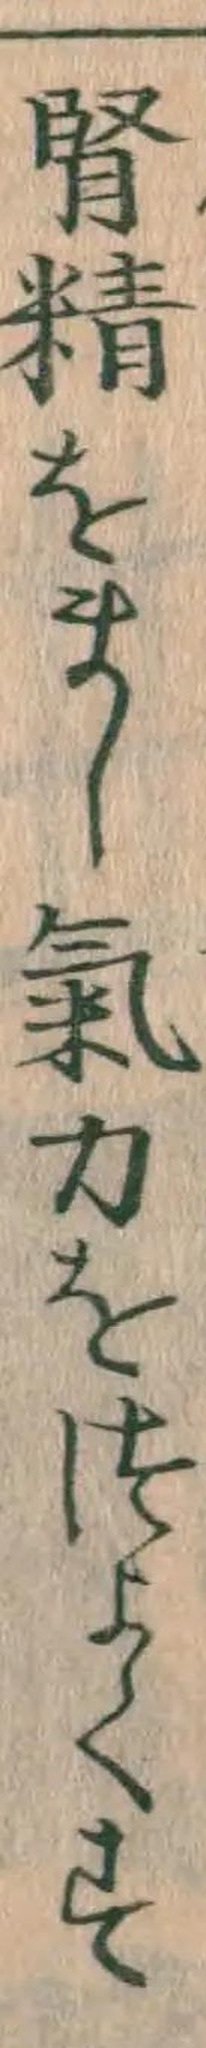腎精をまし気力をつよくす
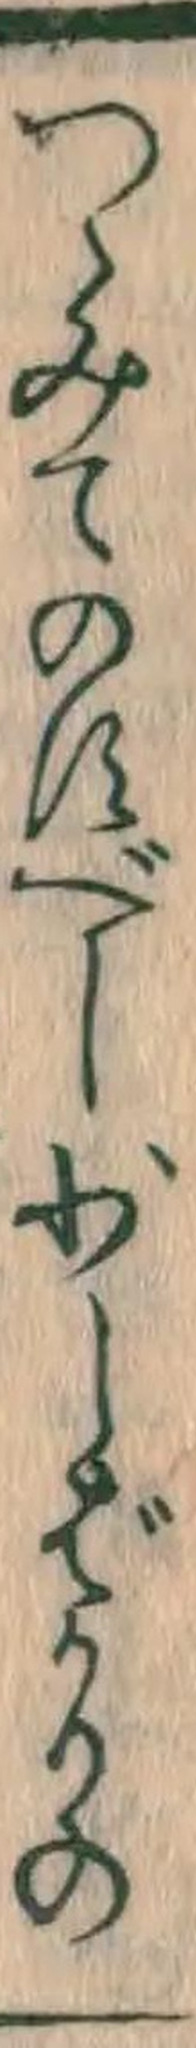つゝみてのすべし少しばかりの
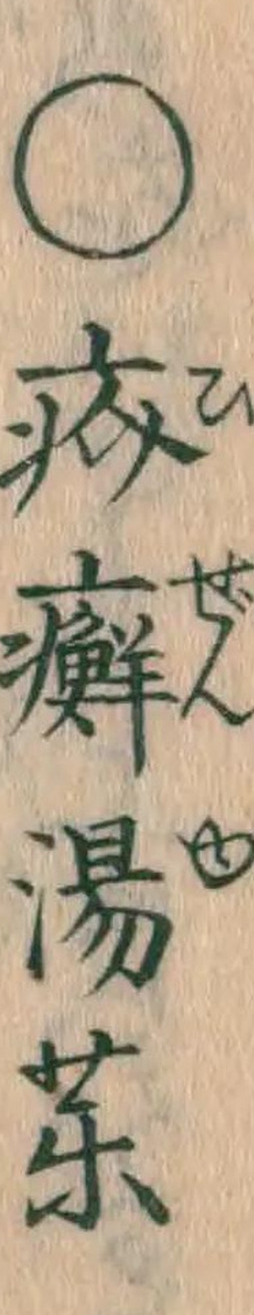○疥癬湯薬
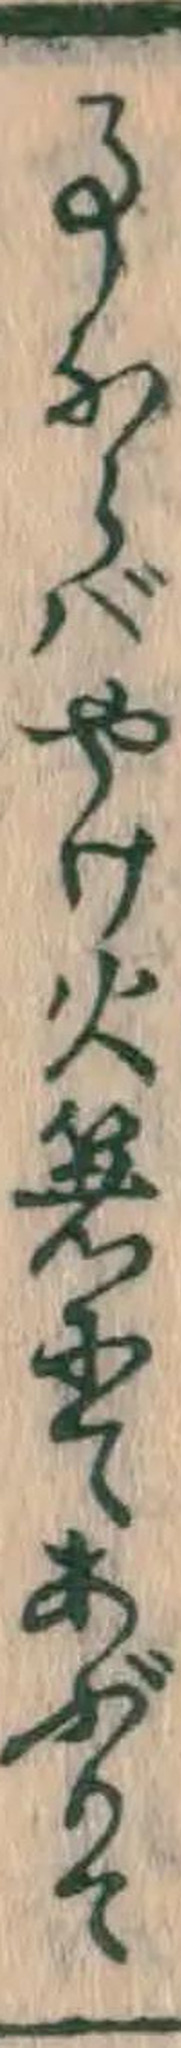事ならばやけ火箸にてあぶりて
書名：広益秘事大全 3巻. [3]
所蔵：国立国会図書館 National Diet Library, JAPAN
